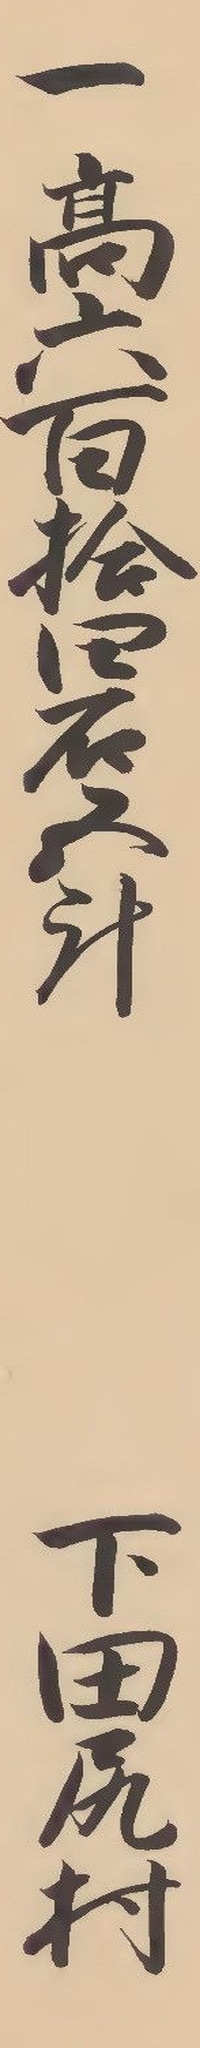一高六百拾四石五斗下田尻村
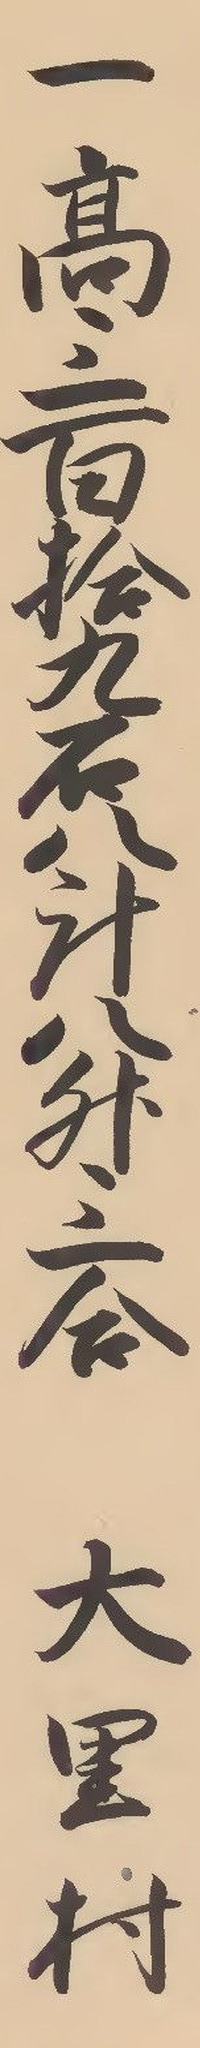一高三百拾九石八斗八升三合大里村

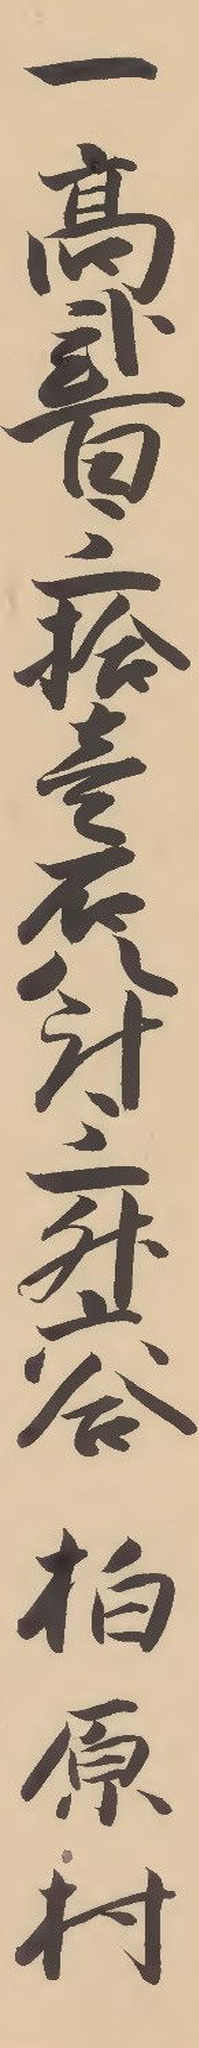一高弐百三拾壱石八斗三升六合柏原村
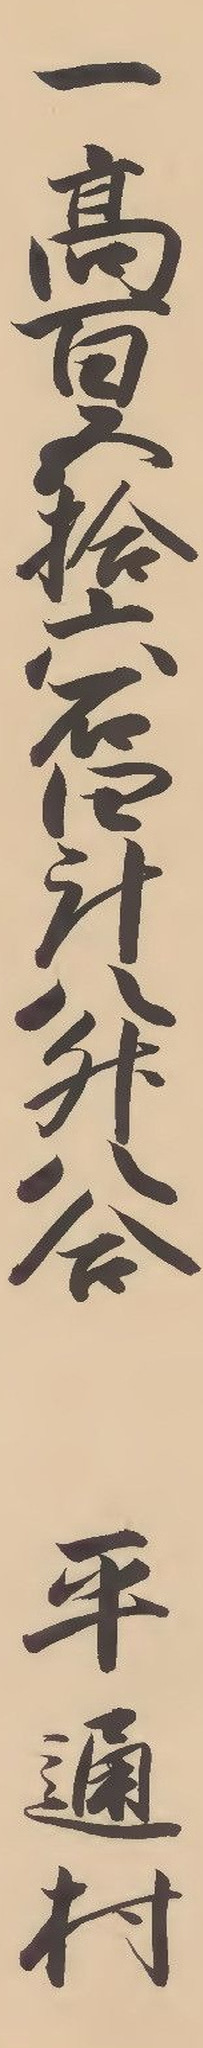一高百五拾六石四斗八升八合平通村
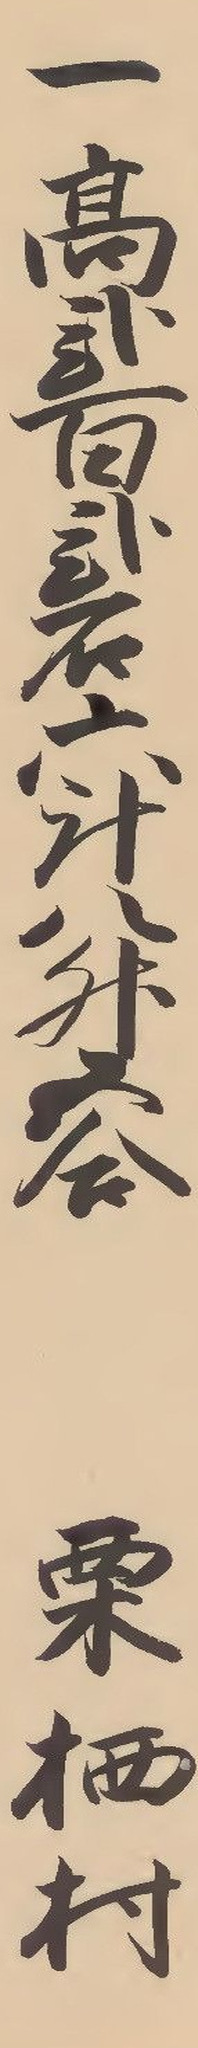一高弐百弐石六斗八升五合栗栖村
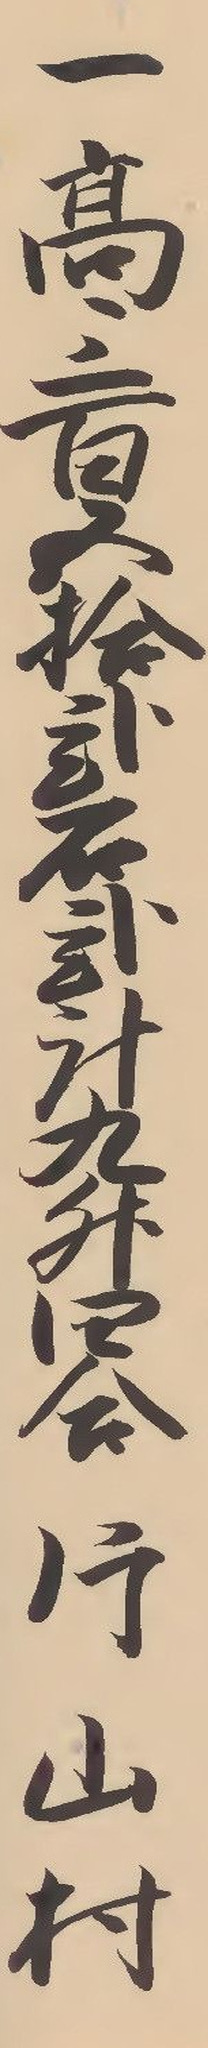一高三百五拾弐石弐斗九升四合片山村
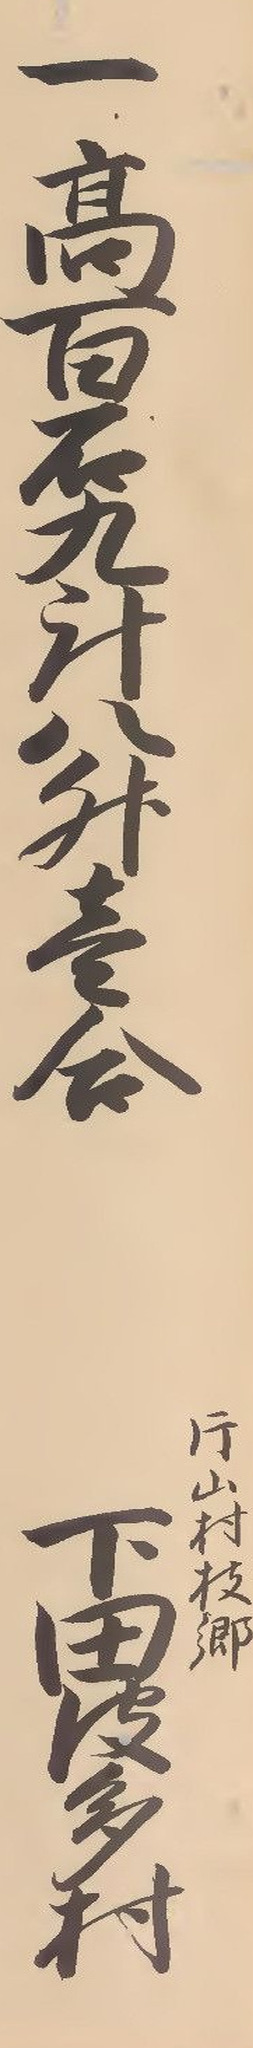一高百石九斗八升壱合下田皮多村
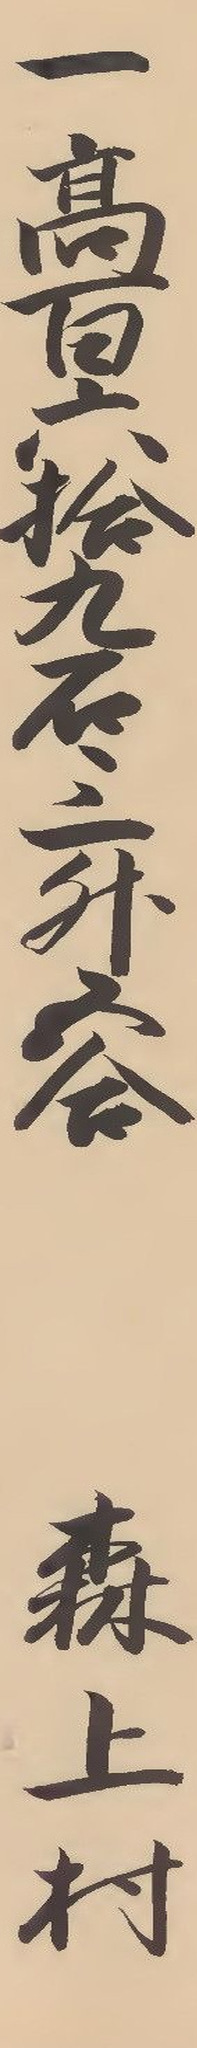一高百六拾九石三升五合森上村
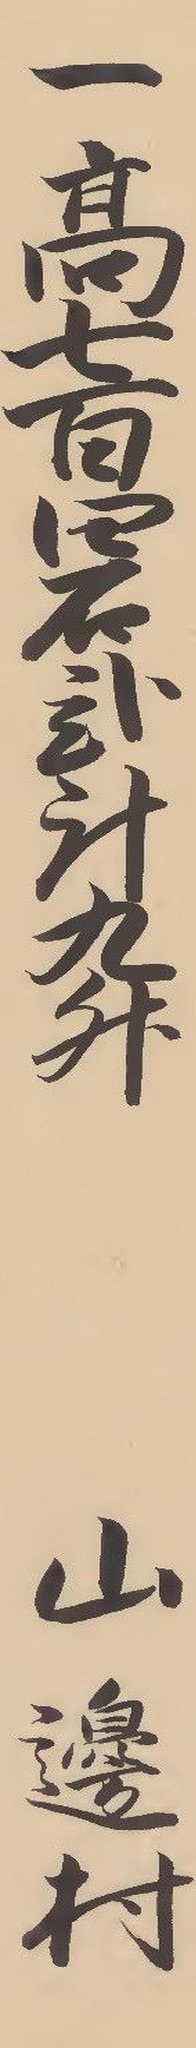一高七百四石弐斗九升山辺村
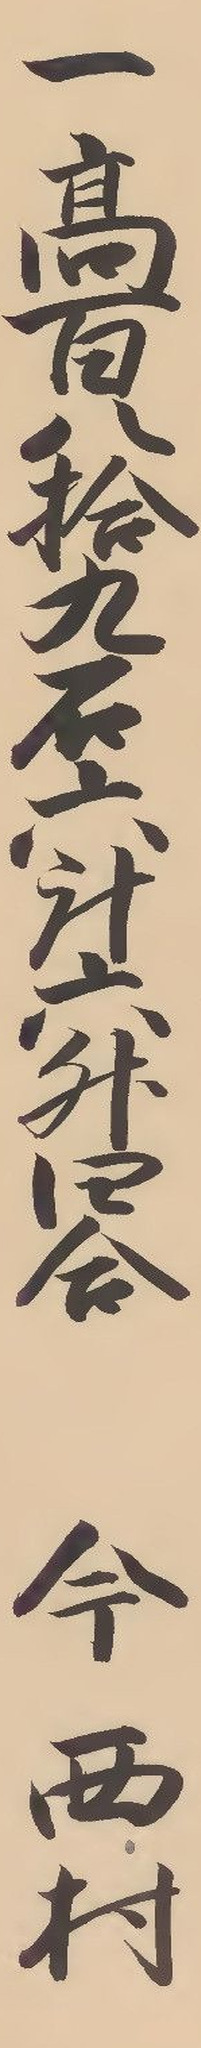一高百八拾九石六斗六升四合今西村

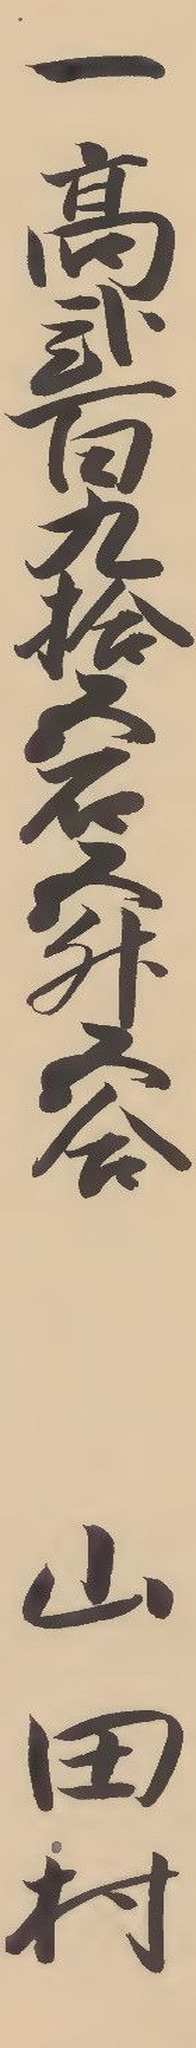一高弐百九拾五石五升五合山田村
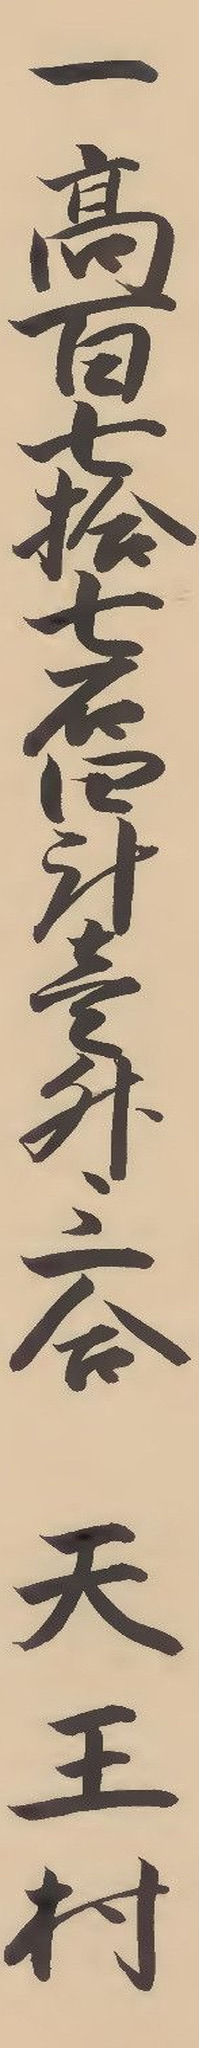一高百七拾七石四斗壱升三合天王村
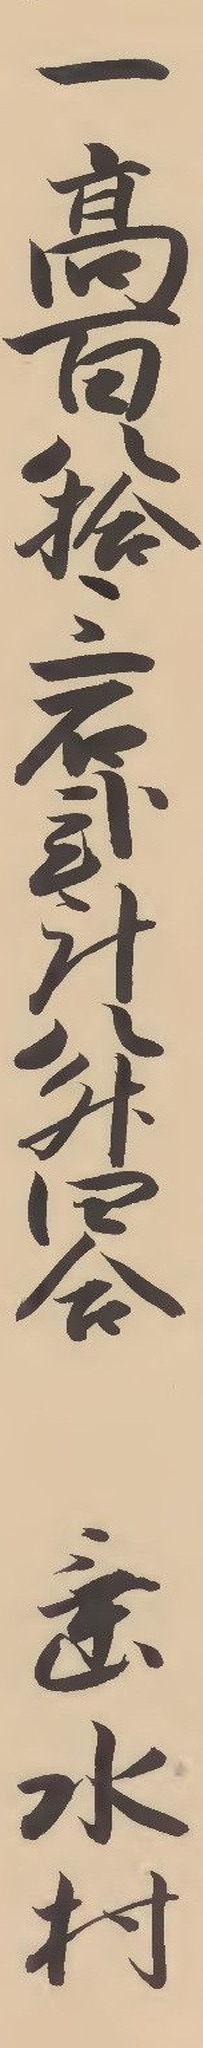一高百八拾三石弐斗八升四合垂水村
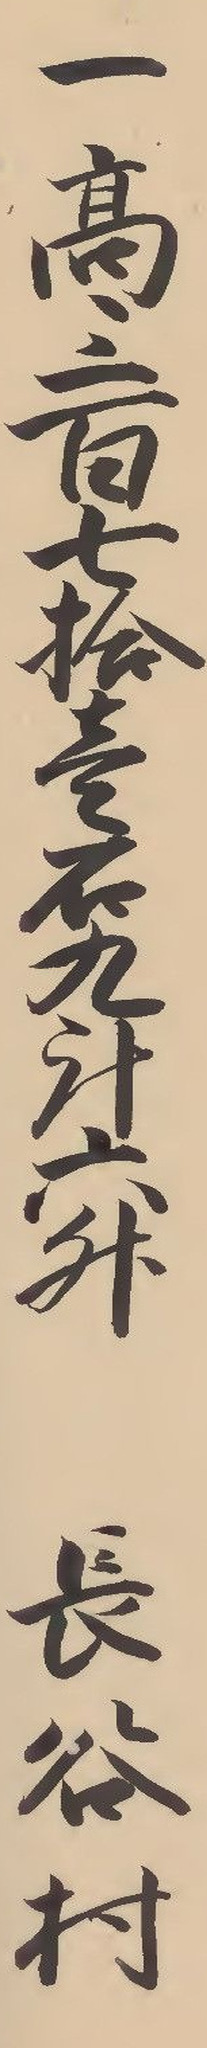一高三百七拾壱石九斗六升長谷村
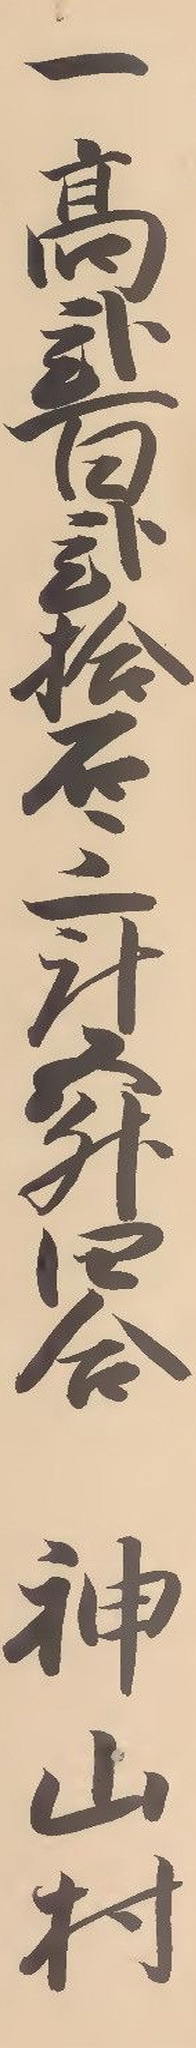一高弐百弐拾石三斗五升四合神山村
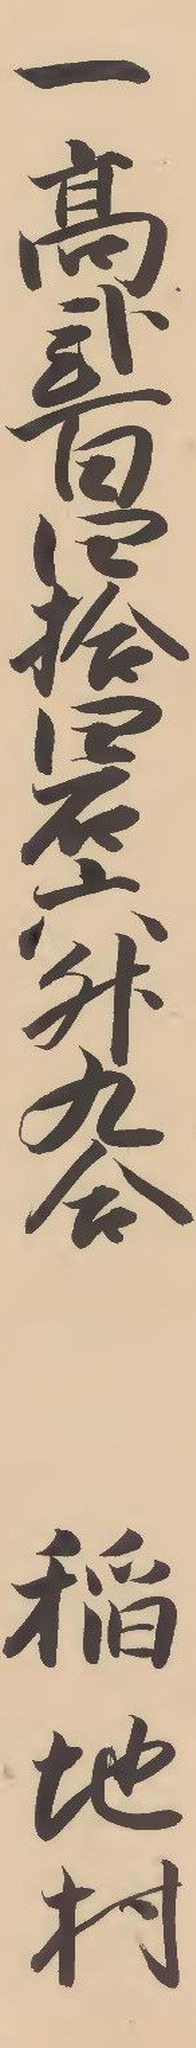一高弐百四拾四石六升九合稲地村
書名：摂津国郷帳
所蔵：国立公文書館 National Archives of Japan
